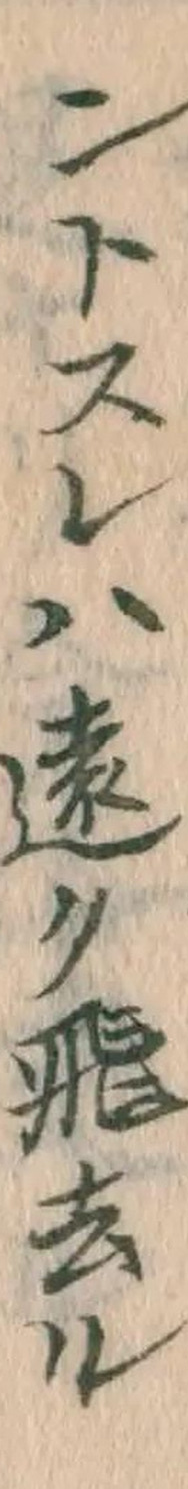ントスレハ遠ク飛去ル
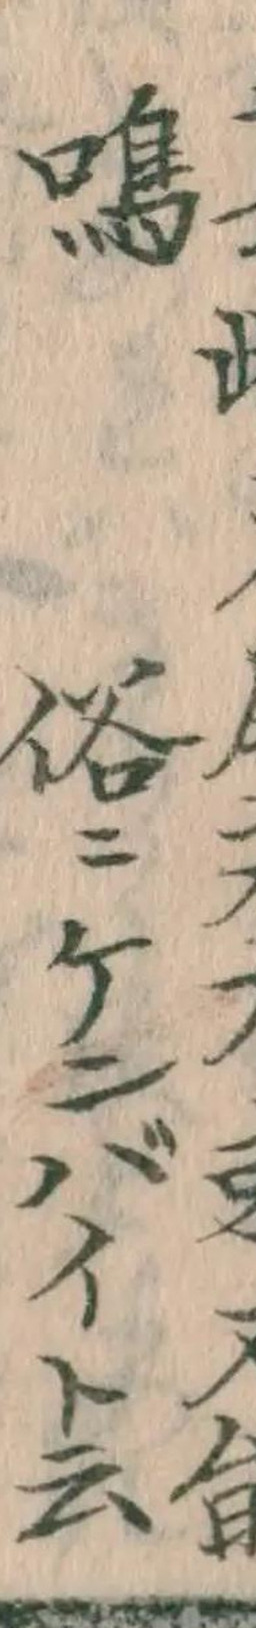鳴俗ニケンバイト云
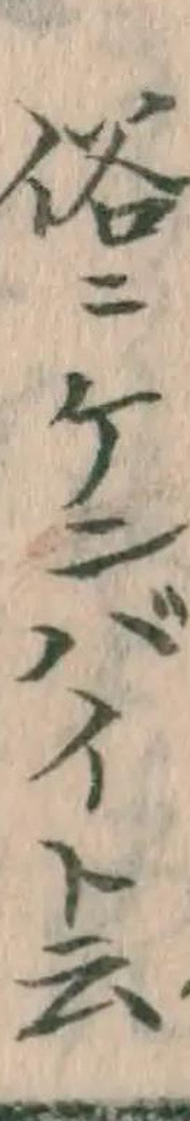鳴俗ニケンバイト云

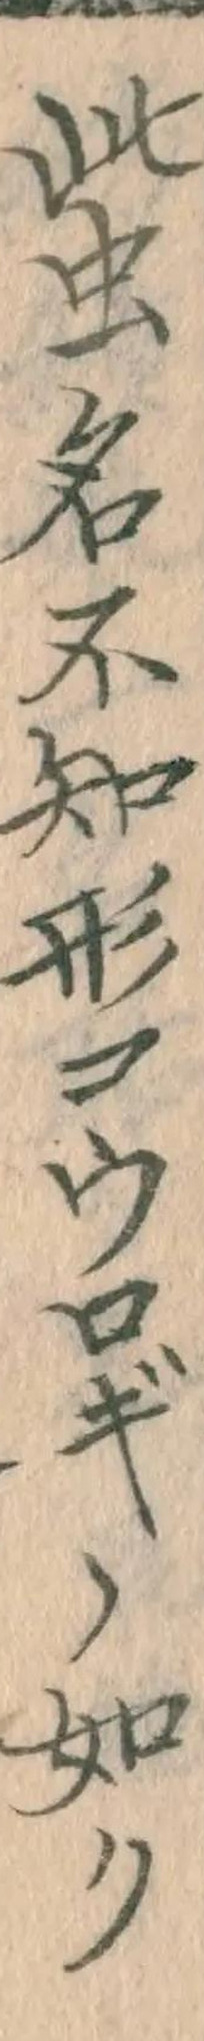此虫名不知形コウロギノ如ク
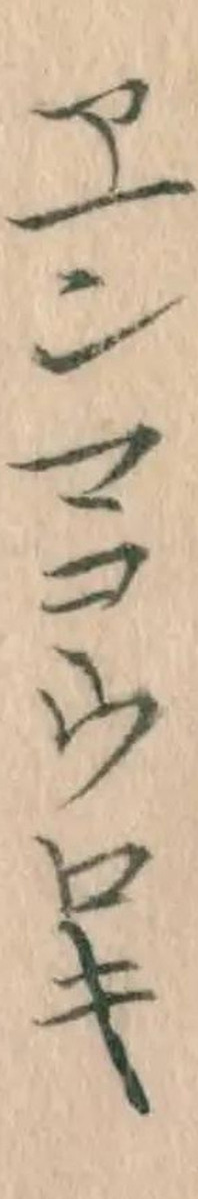ヱンマコウロキ
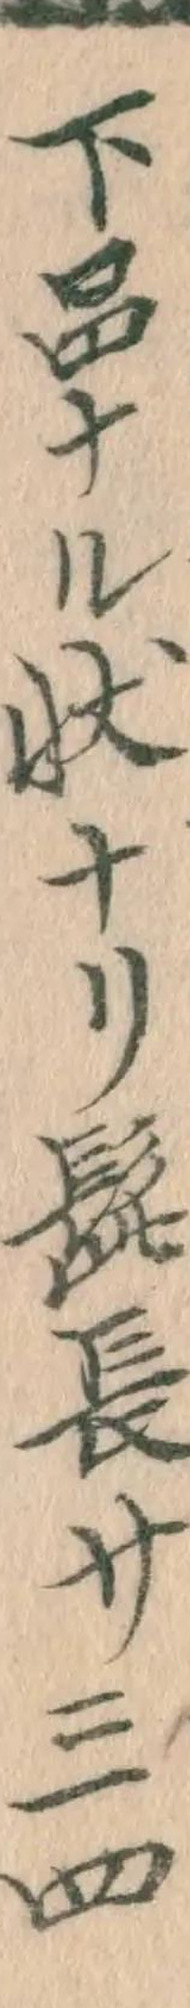下品ナル状ナリ髭長サ三四
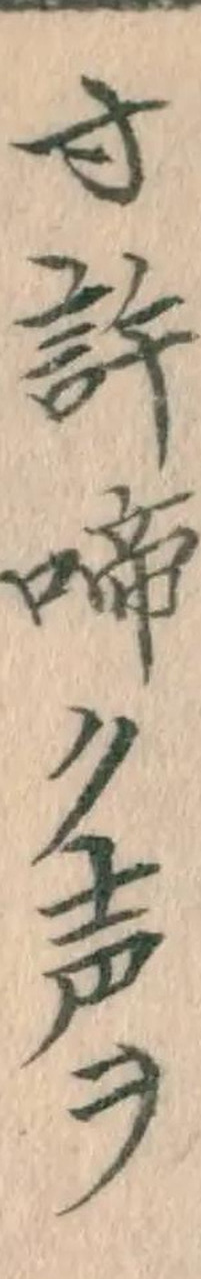寸許啼ク声ヲ
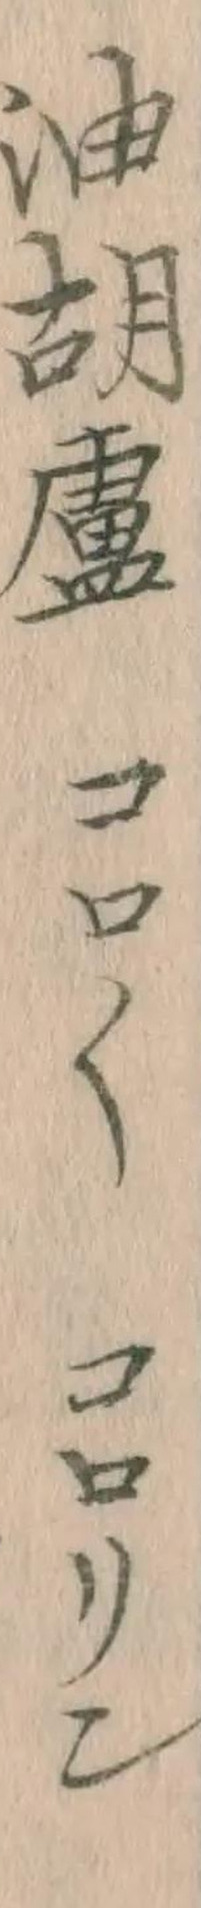油胡蘆コロ〱コロリン
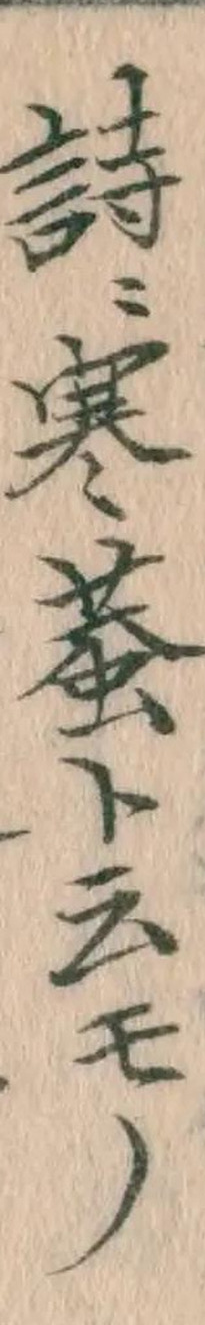詩ニ寒蛬ト云モノ
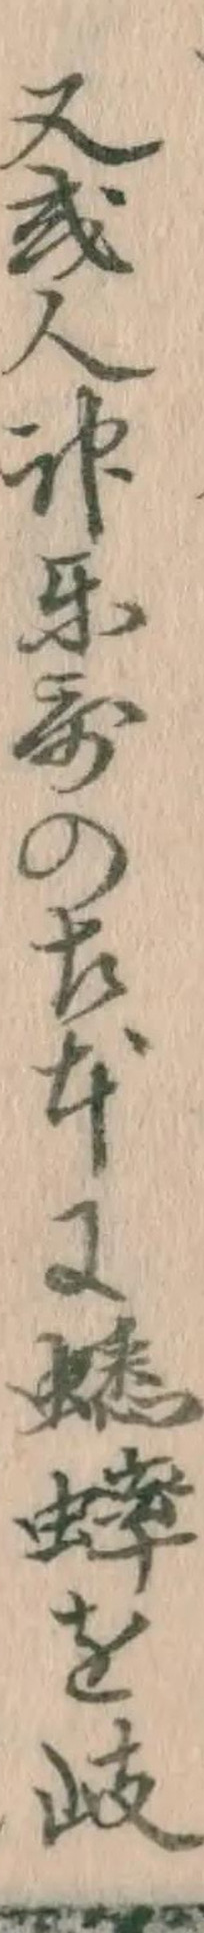又或人神薬哥の古本に蟋蟀を岐
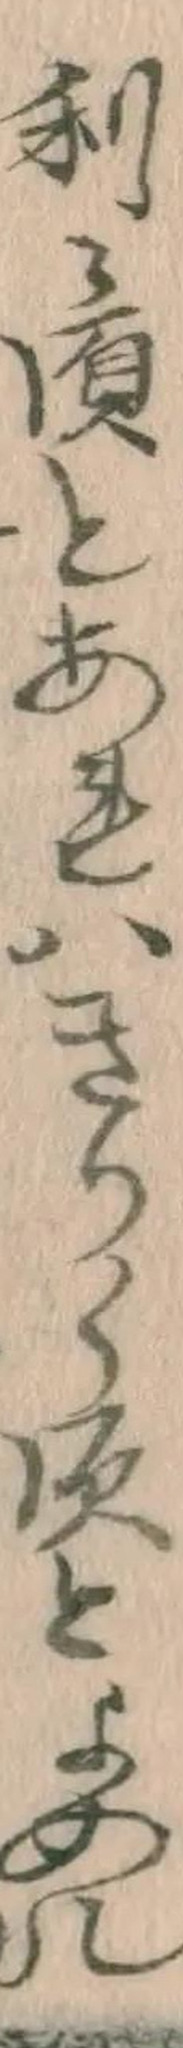利々須とあれはきり〱すとよめれ
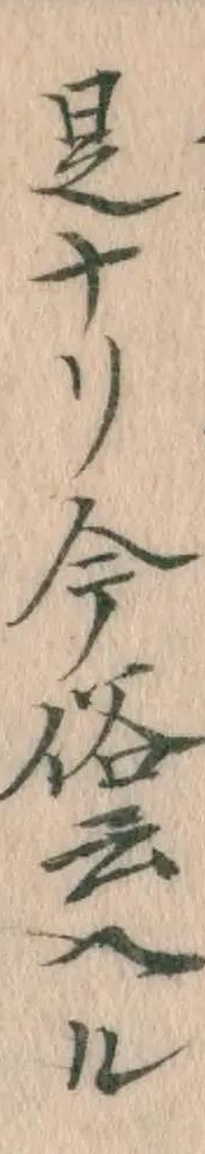是ナリ今俗云ヘル
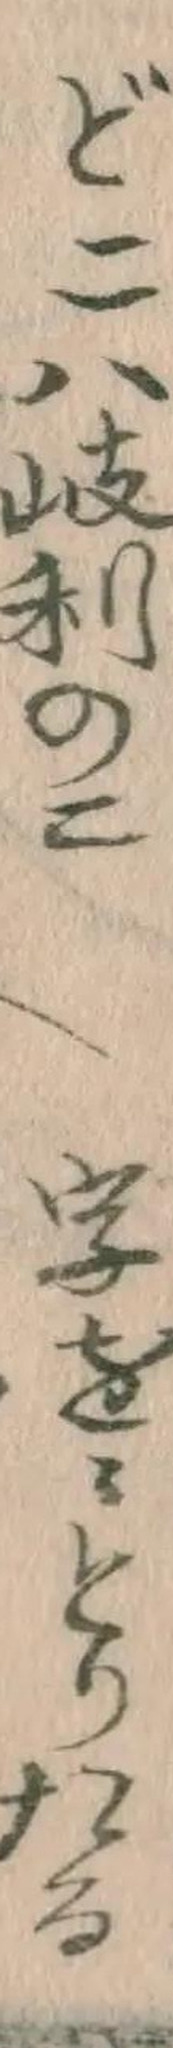どこは岐利の二字をみとりたる
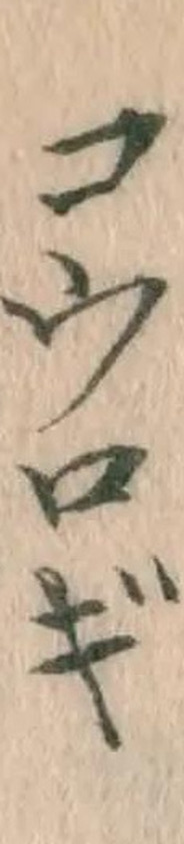コウロギ
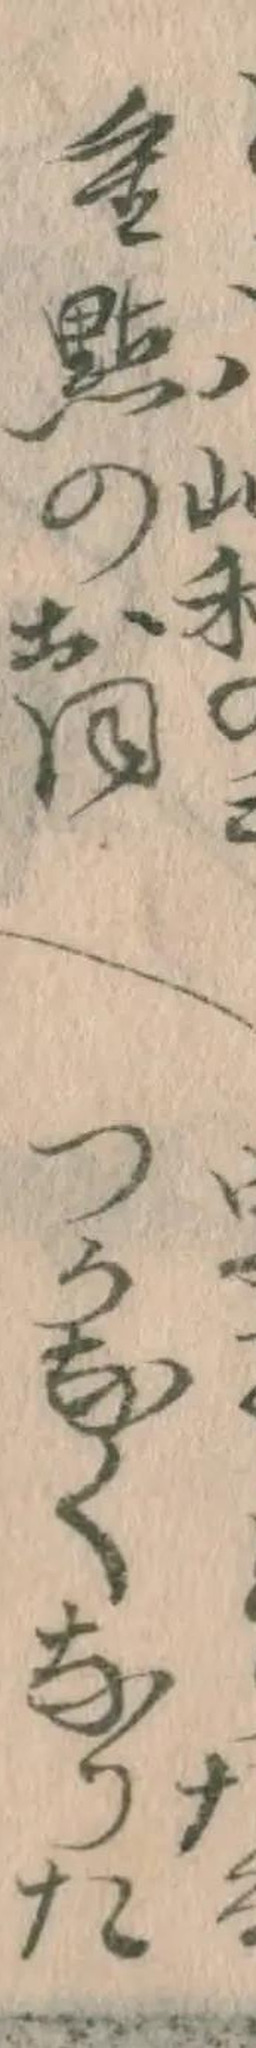重點のおほつかなくなりた
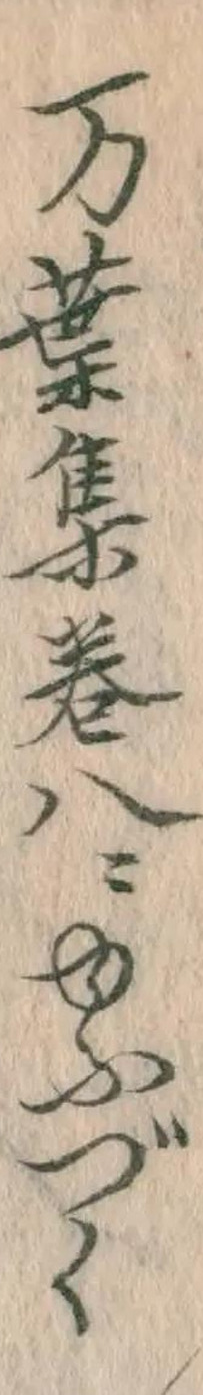万葉集巻八ニゆふづく
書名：千蟲譜 3巻. [3]
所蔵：国立国会図書館 National Diet Library, JAPAN
